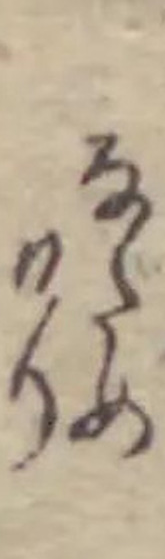なだめ
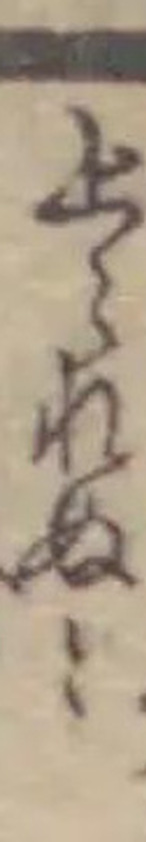上られぬと
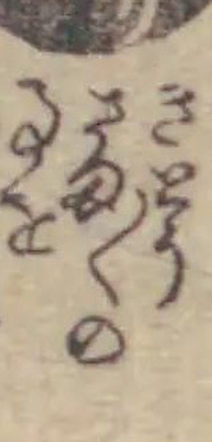(上り)さま〳〵の
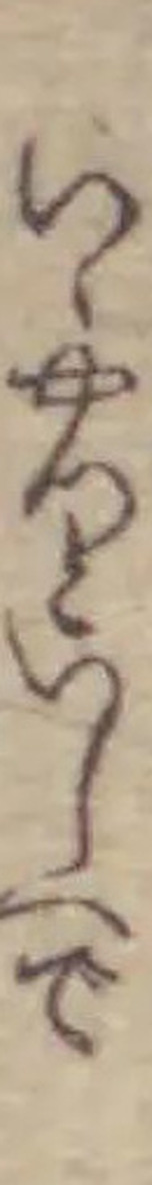いゝやつといしへで
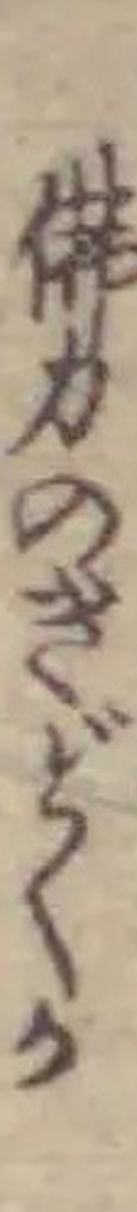仏力のぎどくか
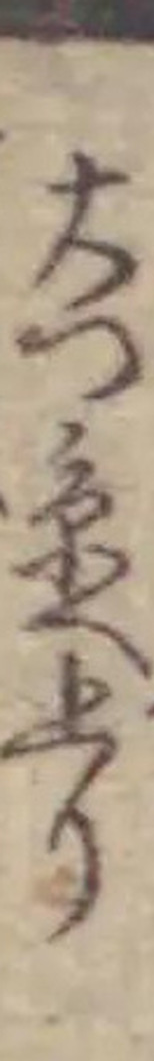大つ京へ上り
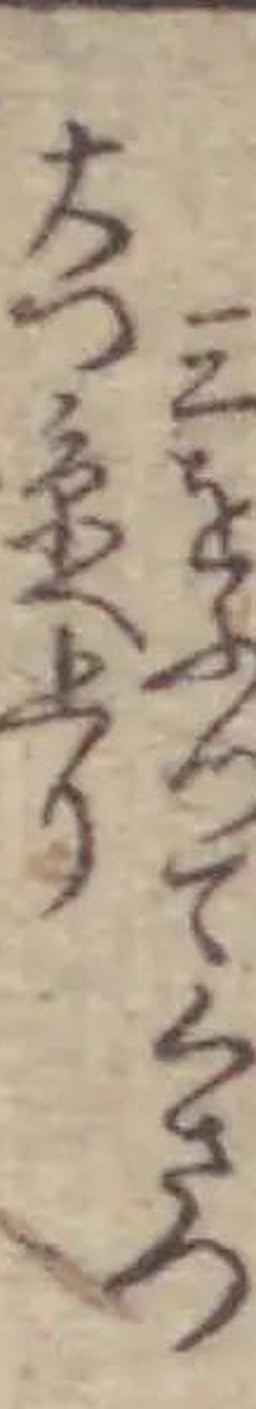大つ京へ上り
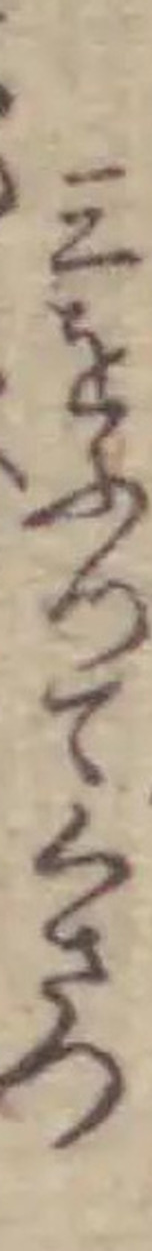さんをふつてくさつ
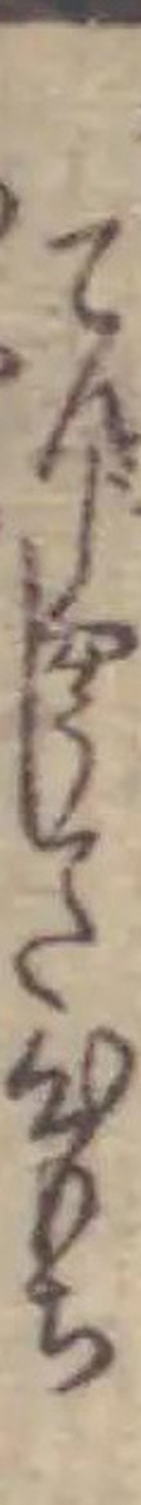てんじやうした心もち
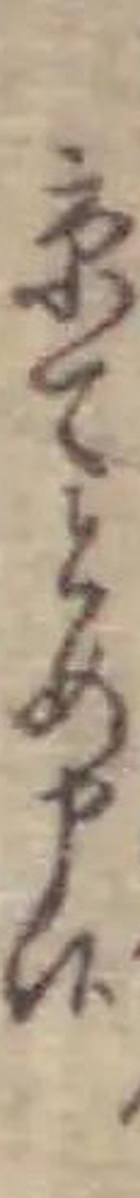京てとめ申候
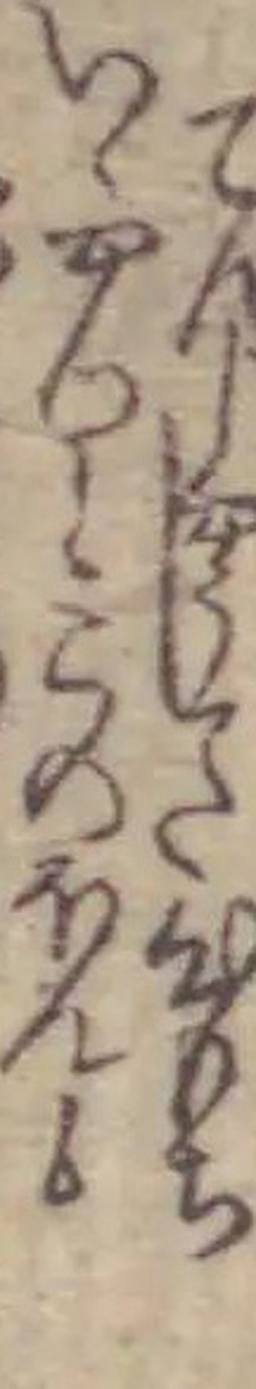いゝやつとこのほんも
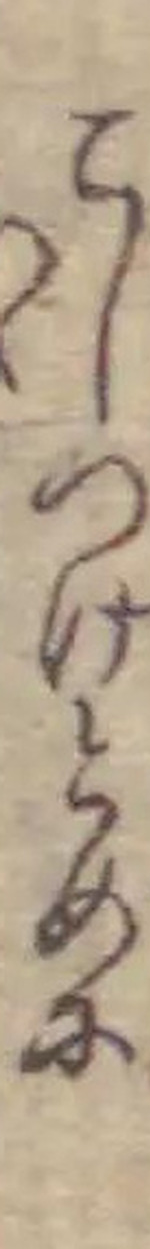こしつけとめに
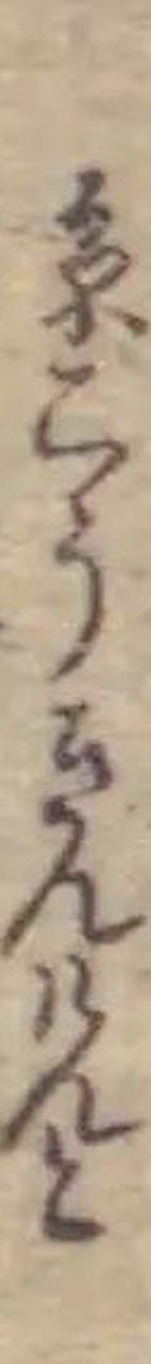京こうきんけんと

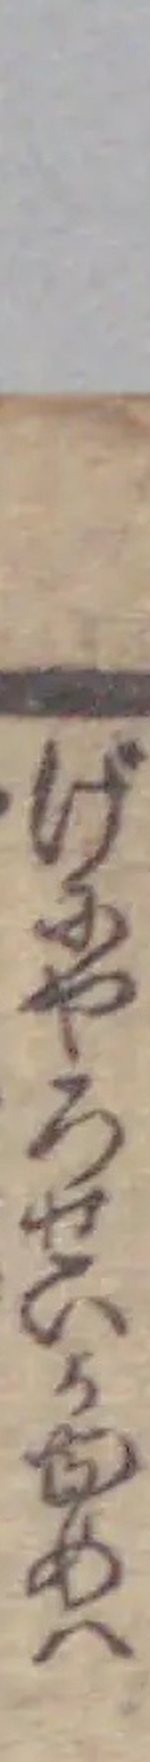げにやろせいかゆめは
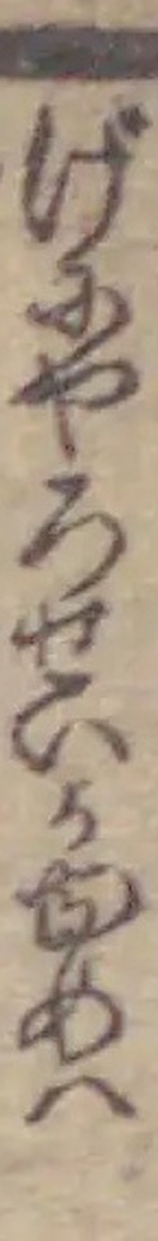げにやろせいかゆめは
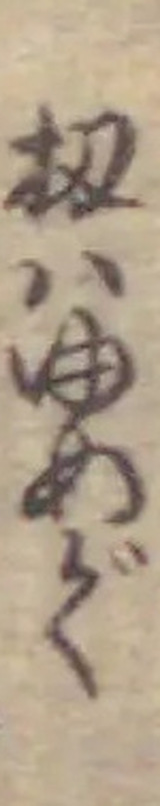扨はゆめで
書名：道笑双六
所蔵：国立国会図書館 National Diet Library, JAPAN
